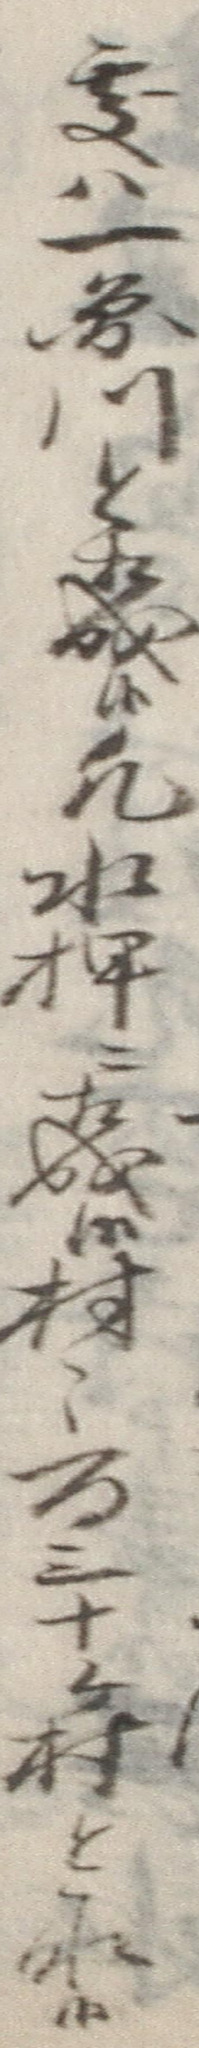処ハ一円川と相成候凡水押ニ相成候村々百三十ケ村と承候
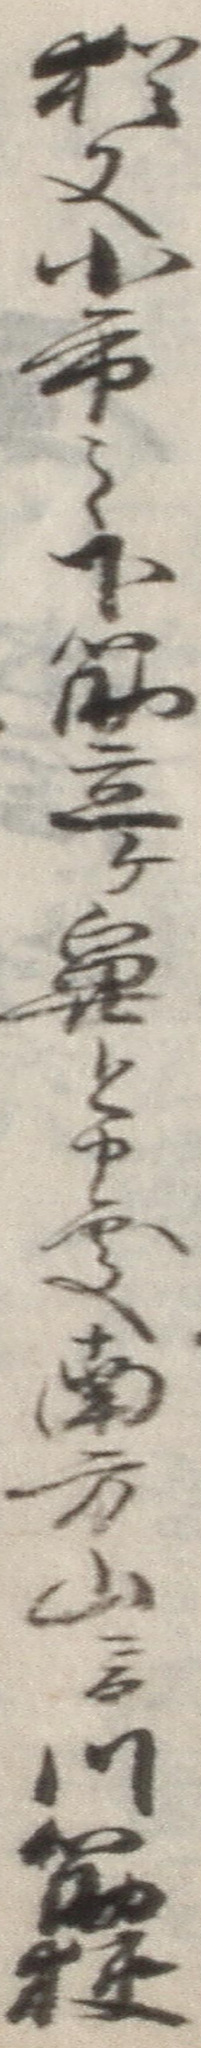猶又小市之下筋立ケ鼻と申処南方山ニ而川筋狭
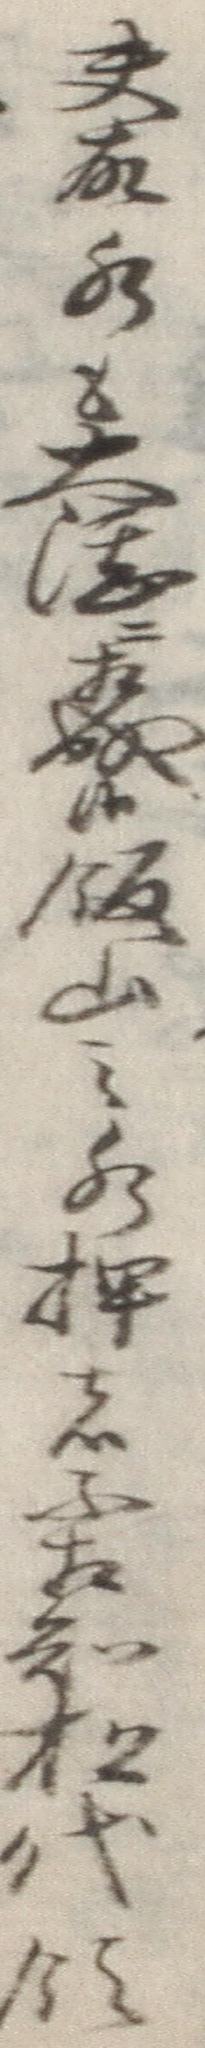夫故水も大湛ニ相成候飯山之水押は不相知松代領
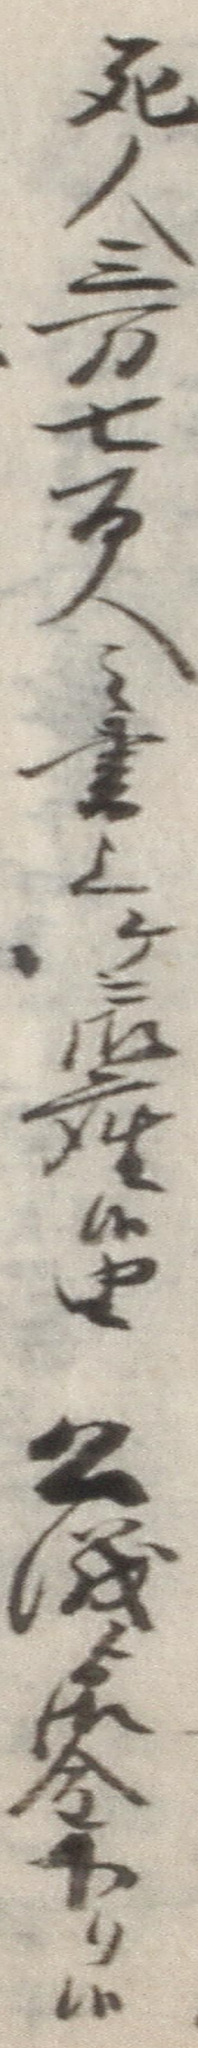死人三万七百人之書上ケニ御座候由公儀ゟ御金下り候
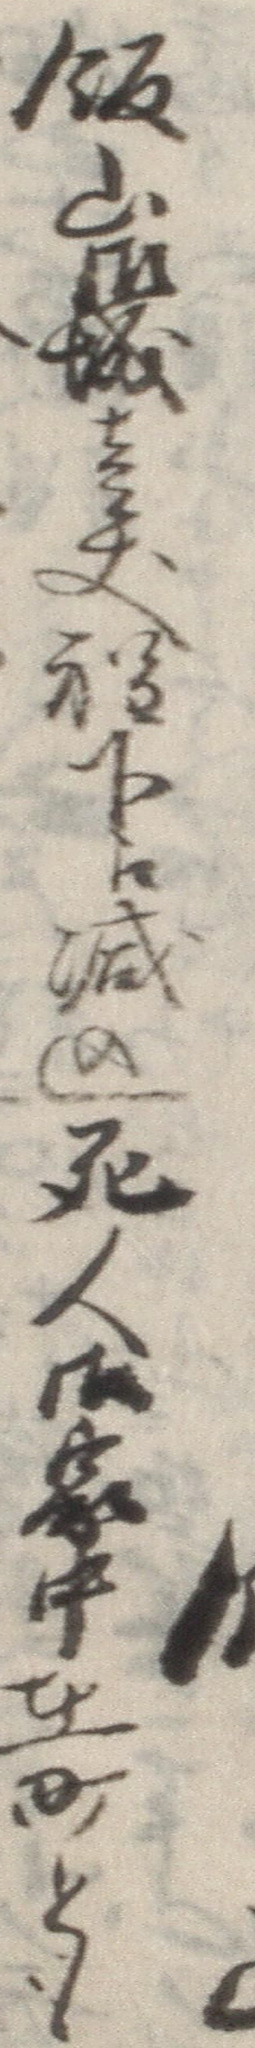飯山御城壱丈程下え減込御家中在町とも
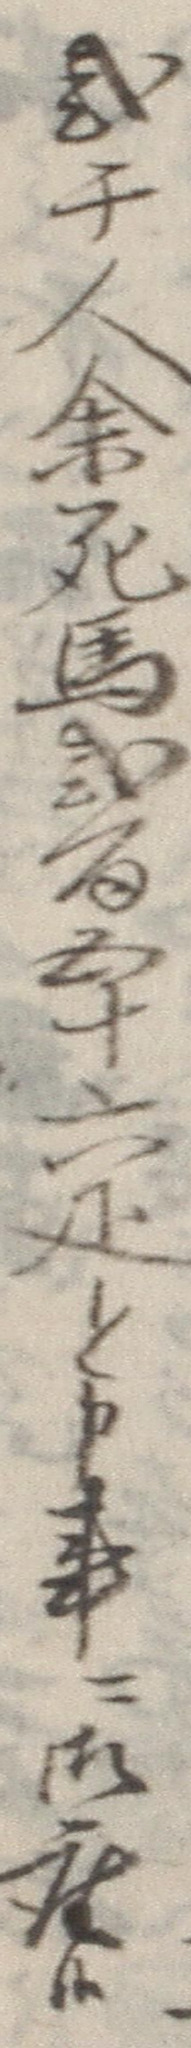弐千人余死馬弐百五十六疋と申事ニ御座候
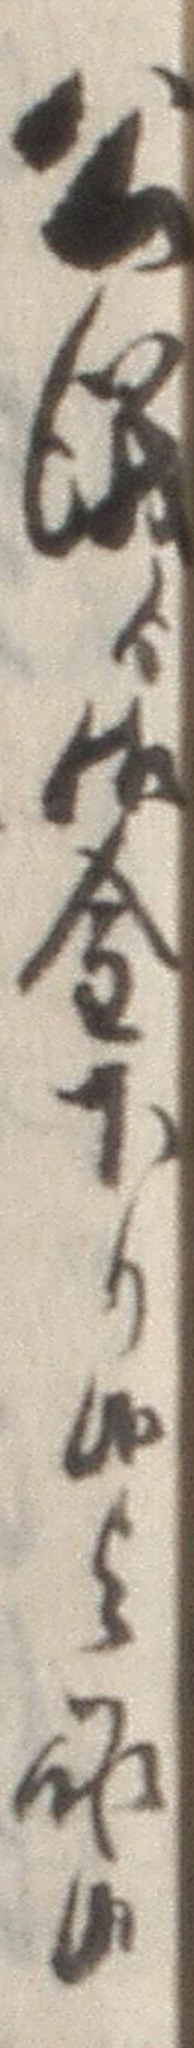公儀ゟ御金下り候と承候
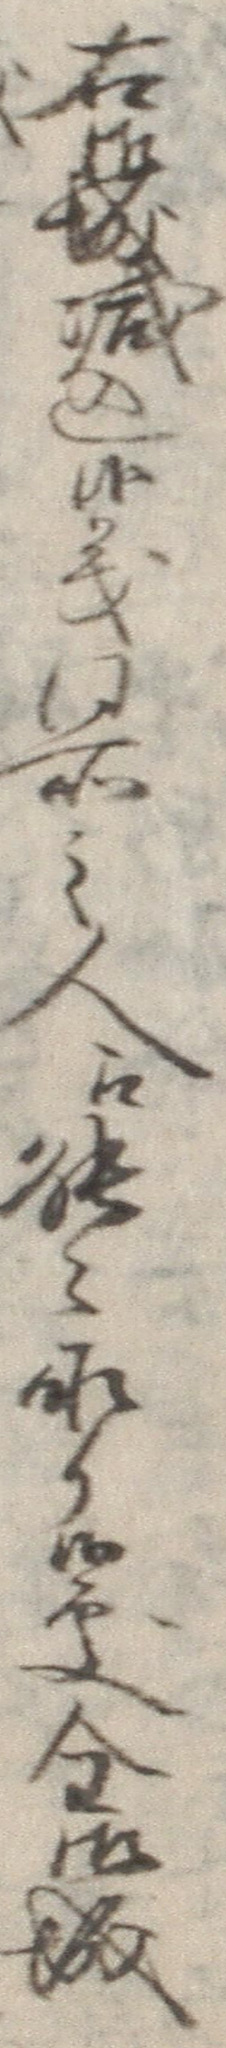右御城減込候義同所之人え能々承り候処全御城
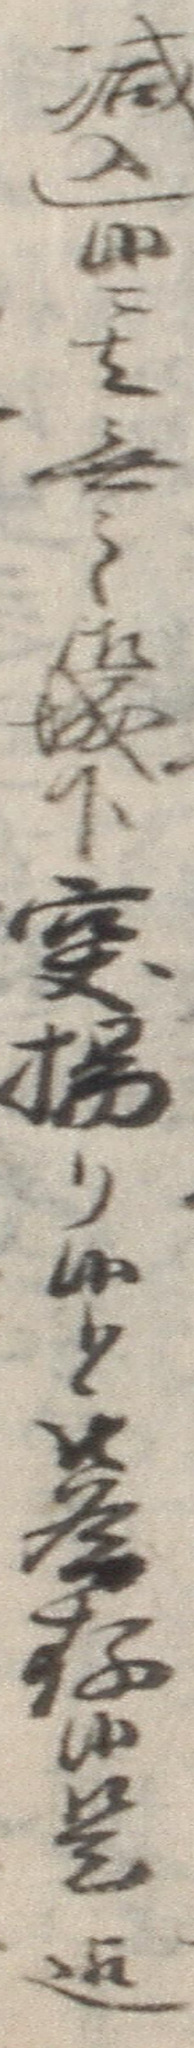減込候ニは無之御城下突揚り候と被為存候是迄
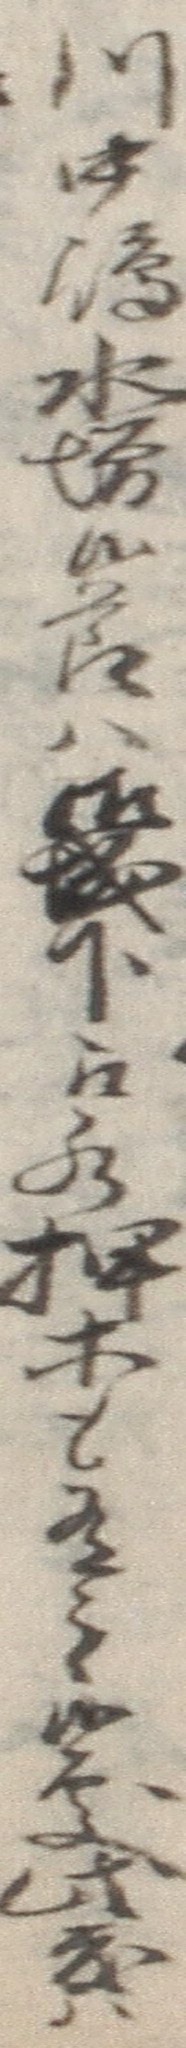川中嶋水増候節ハ御城下え水押等も有之候処此度ハ
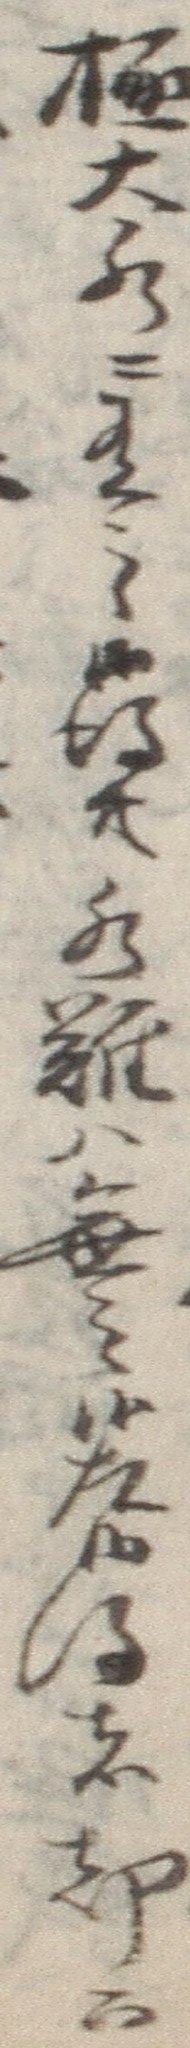極大水ニ有之候得共水難ハ毎々御座候得は却而
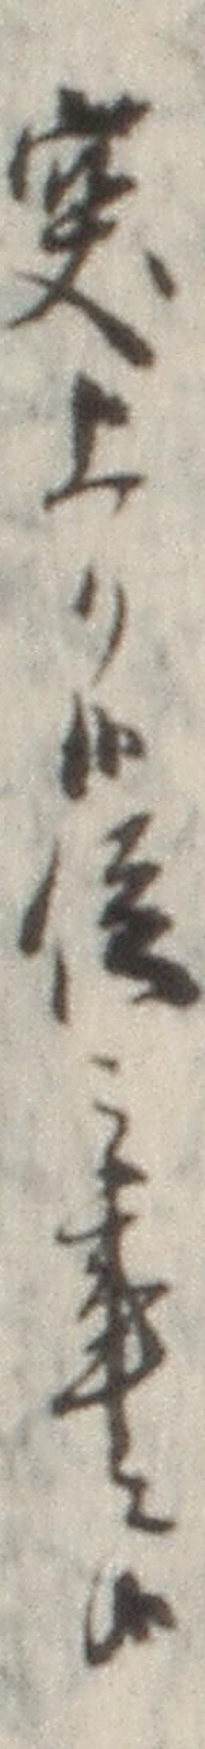突上り候段之事ニ候
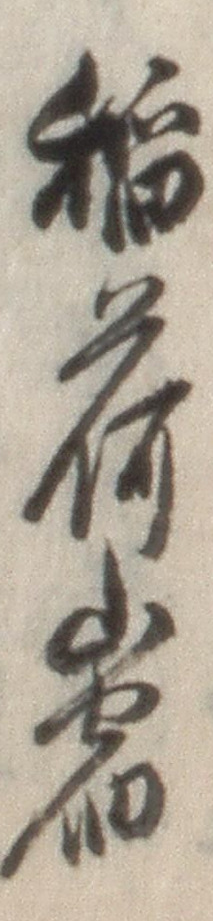稲荷山宿
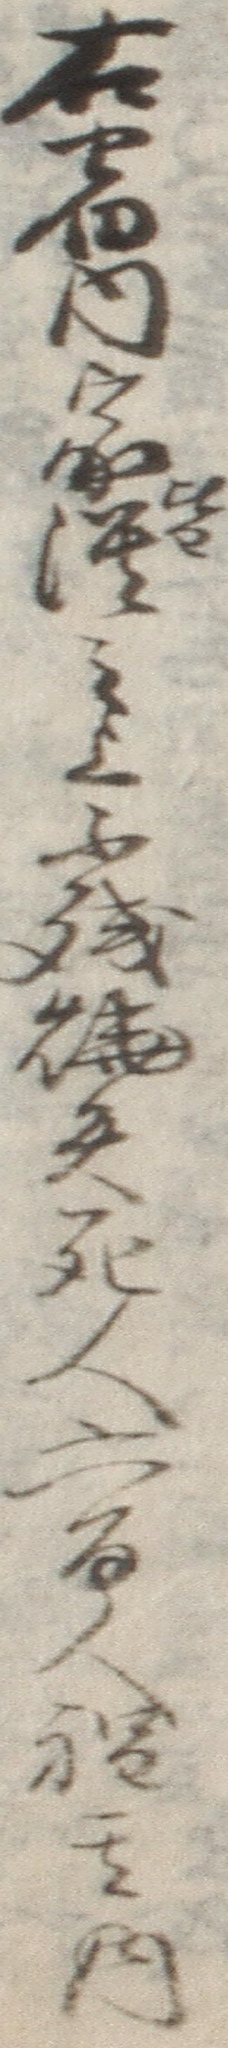右宿内家皆潰其上不残焼失死人六百人程其内
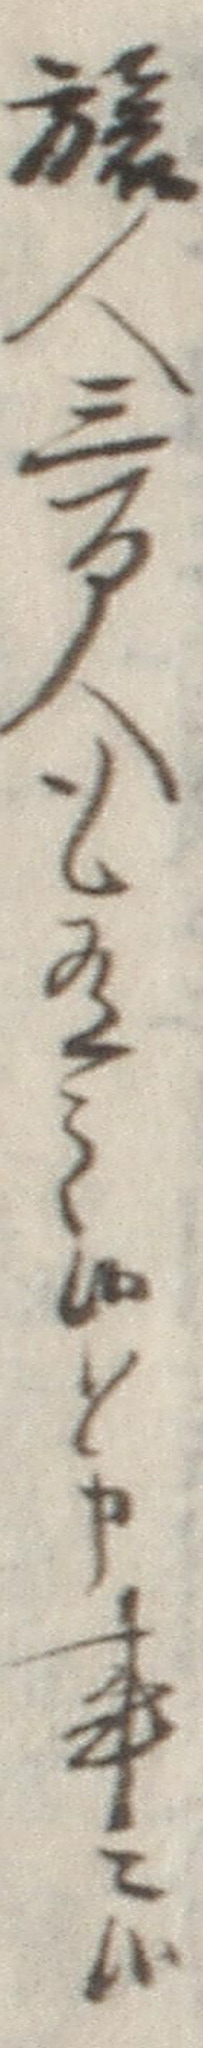旅人三百人も有之候と申事ニ候
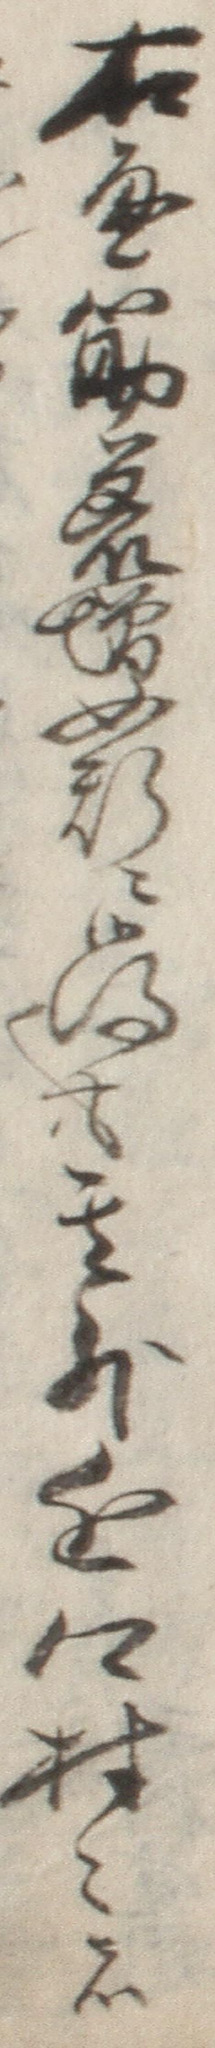右通筋荒増如斯ニ候得共其外近郷村々は
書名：[善光寺地震に関する冊子]
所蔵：東京大学地震研究所図書室 Earthquake Research Institute Library, The University of Tokyo, JAPAN
